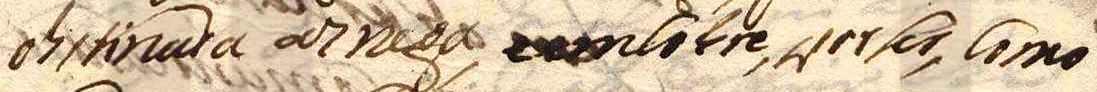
obstinada as nega, e emcobre, por ser, como
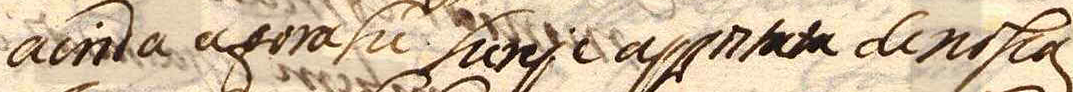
ainda agora hé hereje appostata de nossa
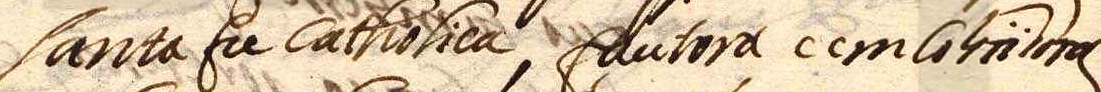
santa fee catholica, fautora, e emCobridora
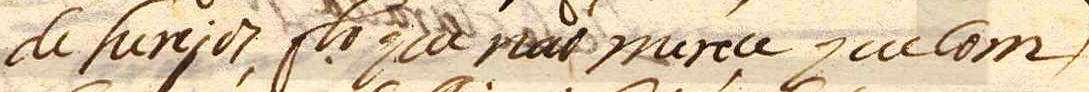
de herejes, plo que naõ merece que com
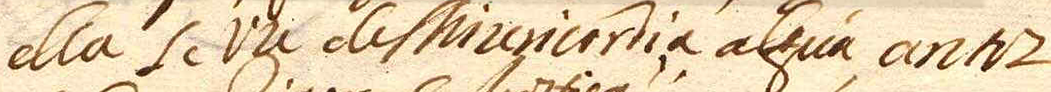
ella se vze de Mizericordia, alguā, antez
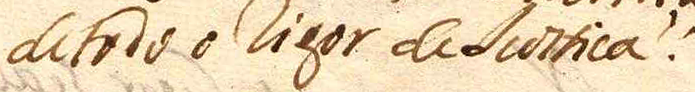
de todo o Rigor de Iustiça!
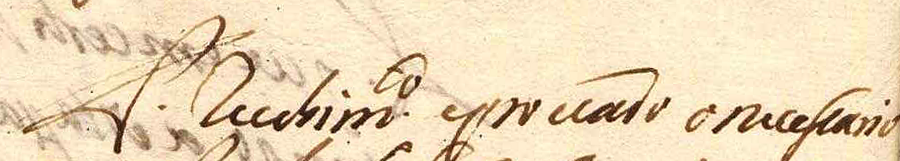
P. Recebim.to e prouado o necessario
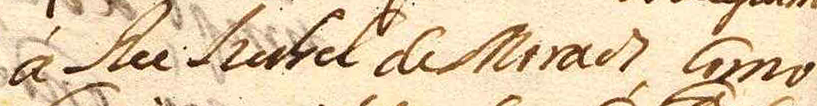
á Ree Izabel de Moraes, como
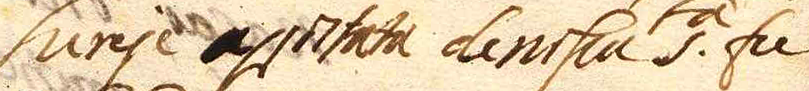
hereje apostata de nossa s.ta fee
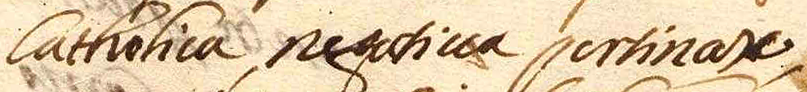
Catholica, negatiua pertinax,
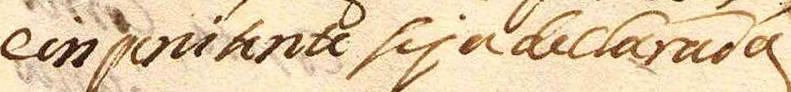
e inpenitente seja declarada
